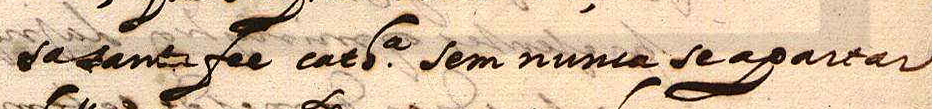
sa santa fee cath.a sem nunca se apartar
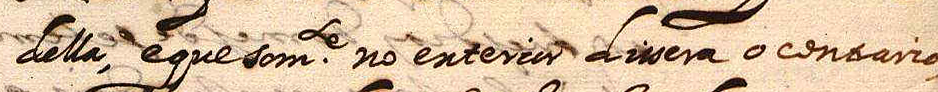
della, e que som.te no enterior dissera o contrario,
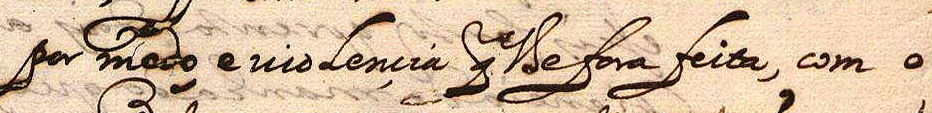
por medo, e uiolencia q̄ lhe fora feita, com o
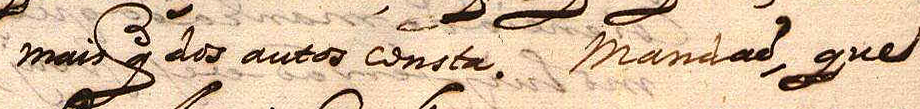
mais q̄ dos autos consta. mandaõ, que
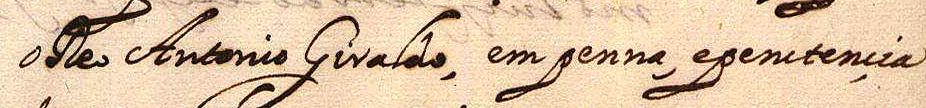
o Reo Antonio Giraldo, em penna, e penitencia
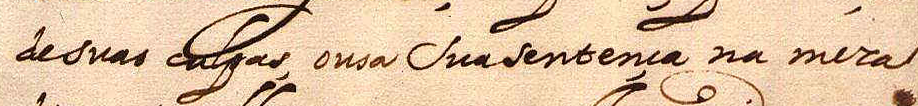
de suas culpas, ousa Sua sentença na meza
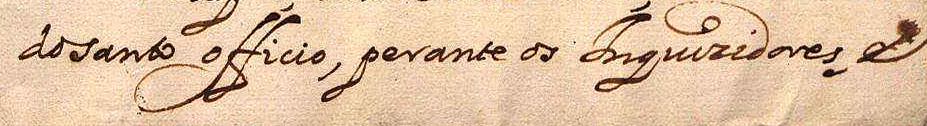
do santo officio, perante os Inquizidores, e
